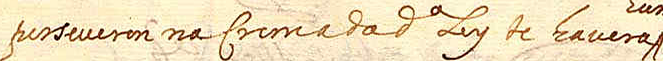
perseuerou na Crenca da da Ley te hauera
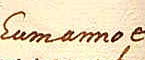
hum anno e
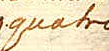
quatro
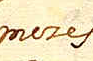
mezes
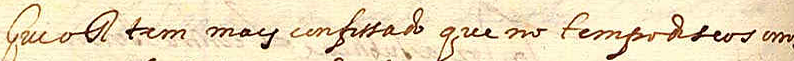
Que o R tem mais confessado que no tempo de seos erros
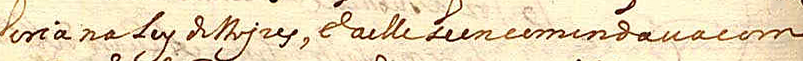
cria na Ley de Mojzes, E a elle se encomendaua com
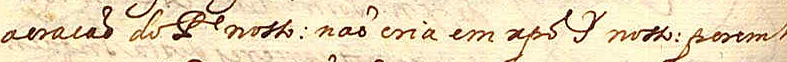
a oracaõ do Pe nosso: naõ cria em xpō sr nosso: porem ti
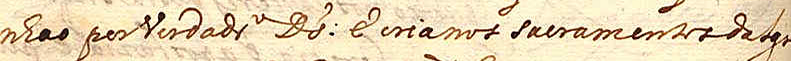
nhao por Verdadro Ds̄: E cria nos sacramentos da Igre
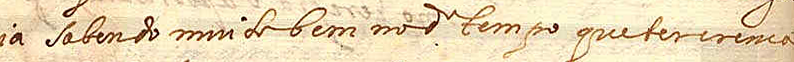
ia sabendo muito bem no do tempo que ter crenca
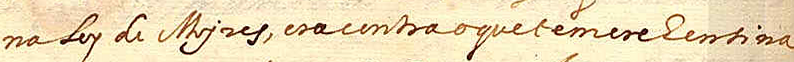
na Ley de Mojzes, era contra o que tem cre E ensina
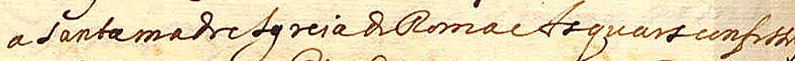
a santa madre Igreia de Roma As quaes confissois
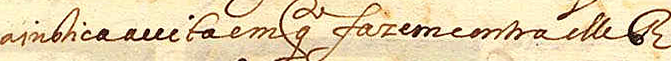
a iustica aceita em qto fazem contra elle R
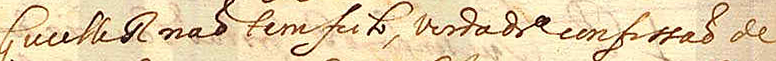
Que elle R naõ tem feito, verdadra confissaõ de
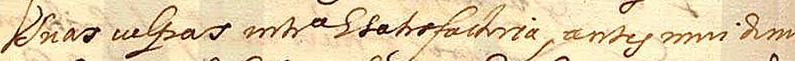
suas culpas intra E satisfactoria, antes mui dimi
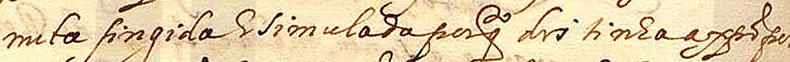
nuta fingida E simulada porqto dis tinha a xpō por
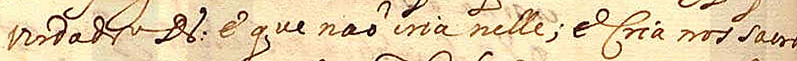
verdadro Ds̄. E que naõ cria nelle; E Cria nos sacra
